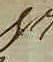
17
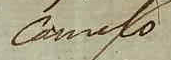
Camelo
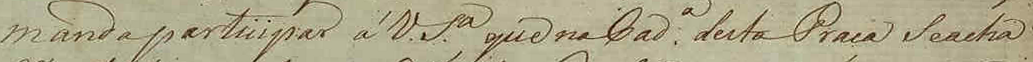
manda participar á V. S.a que na Cad.a desta Praça se acha
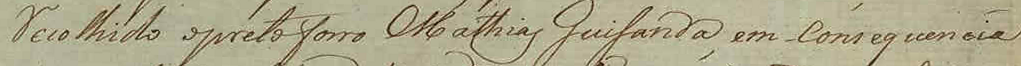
Recolhido o preto forro Mathias Guisanda, em consequencia
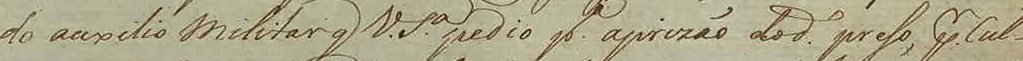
do auxilio militar q̄ V. S.a pedio p.a a prizaõ do d.o preso, p.r Cul
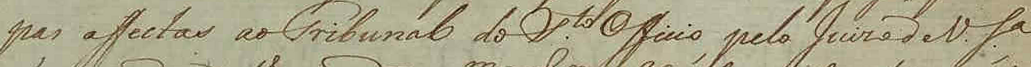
pas affectas ao Tribunal do S.to Officio, pelo Juizo de V. S.a
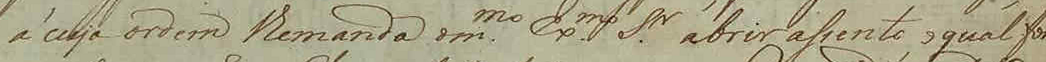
á cuja ordem lhe manda o m.mo Ex.mo S.r abrir assento, o qual foi
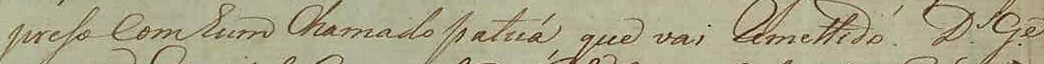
preso com hum chamado patuá, que vai Remettido. D.s G.e
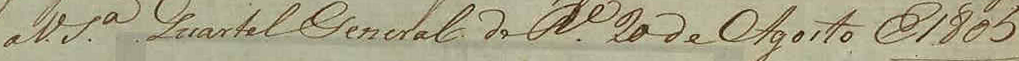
a V. S.a Quartel General de R.e 20 de Agosto d̄ 1805
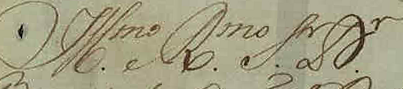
Ill.mo e R.mo S.r D.r
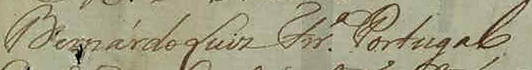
Bernardo Luiz Frr.a Portugal,
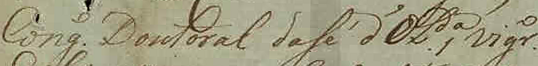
Cong.o Doutoral da fé d'OL.da, vigr.o
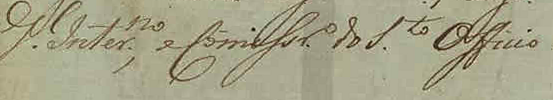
G.l Inter.no, e Comissr.o do S.to Officio.
